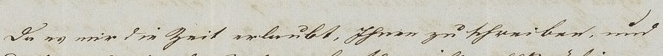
Da es mir die Zeit erlaubt, Ihnen zu schreiben, und
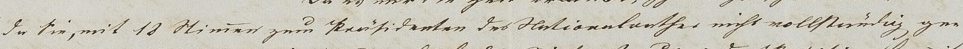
da Sie, mit 12 Stimmen zum Präsidenten des Nationalrathes nicht vollständig ge-
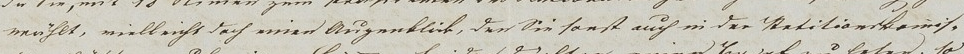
wählt, vielleicht doch einen Augenblick, den Sie sonst auch in der Petitionskommis-
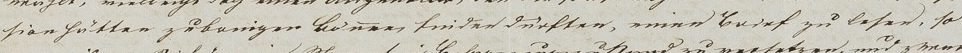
sion hätten zubringen können, finden dürften, einen Brief zu lesen, so
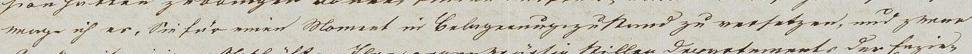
wage ich es, Sie für einen Moment in Belagerungszustand zu versetzen, und zwar
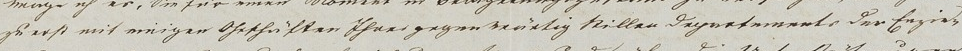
zuerst mit einigen Geschäften Ihres gegenwärtig stillen Departements der Erzie-
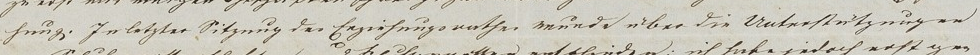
hung. In letzter Sitzung des Erziehungsrathes wurde über die Unterstützungen
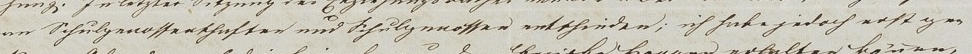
an Schulgenossenschaften und Schulgenossen entschieden; ich habe jedoch erst ge-
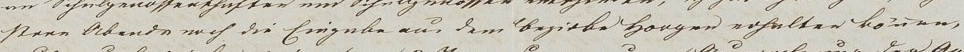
stern Abends noch die Eingabe aus dem Bezirke Horgen erhalten können,
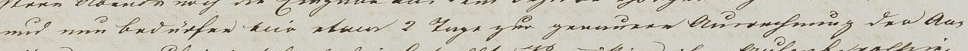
und nun bedürfen wir etwa 2 Tage zur genauer Ausrechnung der An-
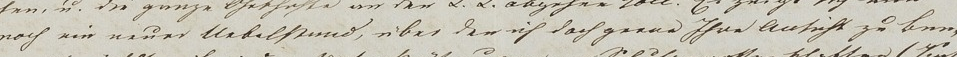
noch ein neuer Uebelstand, über den ich doch gerne Ihre Ansicht zu ken-
